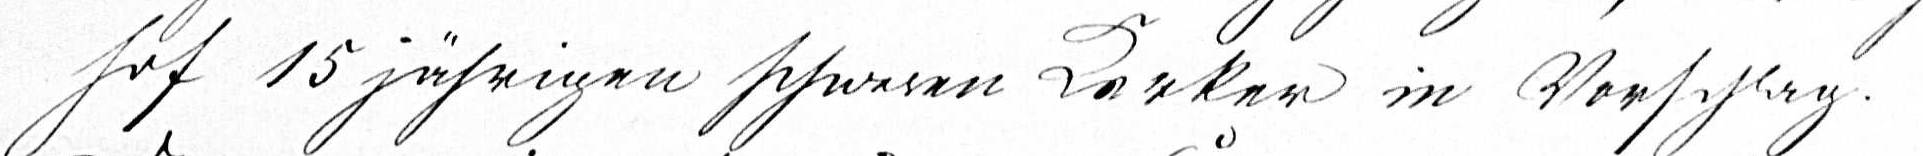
hof 15jährigen schweren Kerker in Vorschlag.
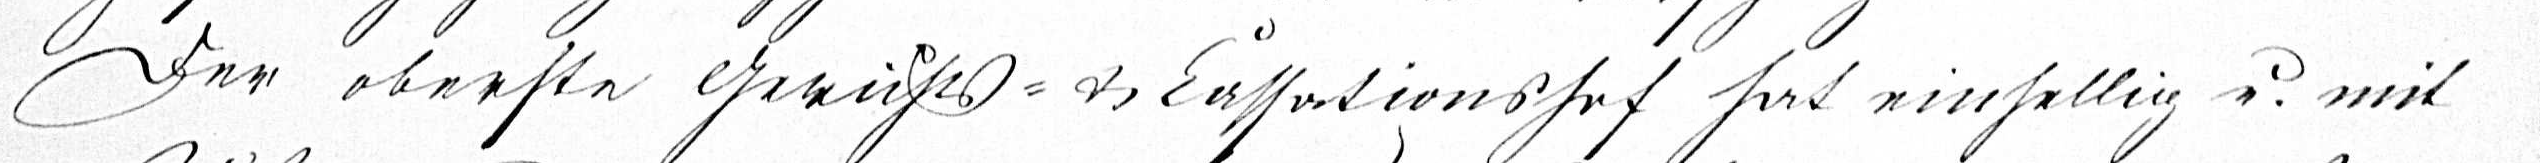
Der oberste Gerichts- u. Cassationshof hat einhellig u mit
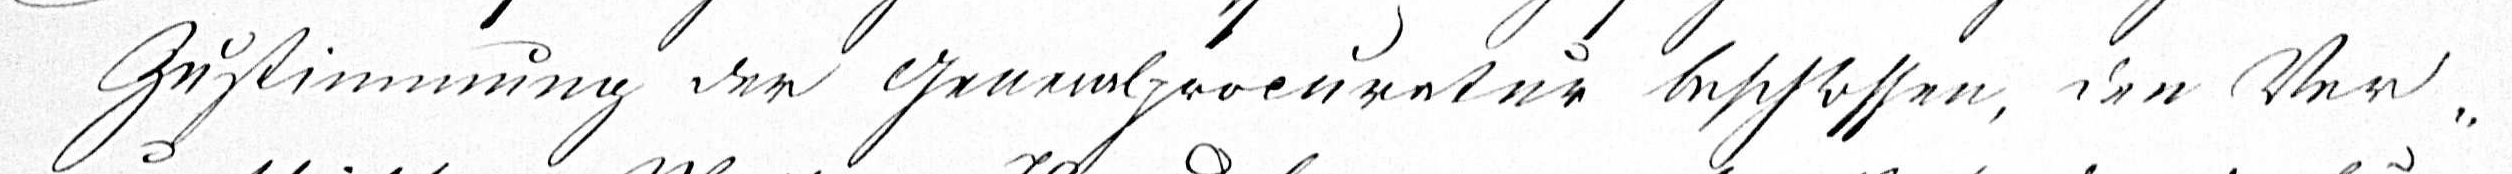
Zustimmung der Generalprocuratur beschlossen, den Ver¬
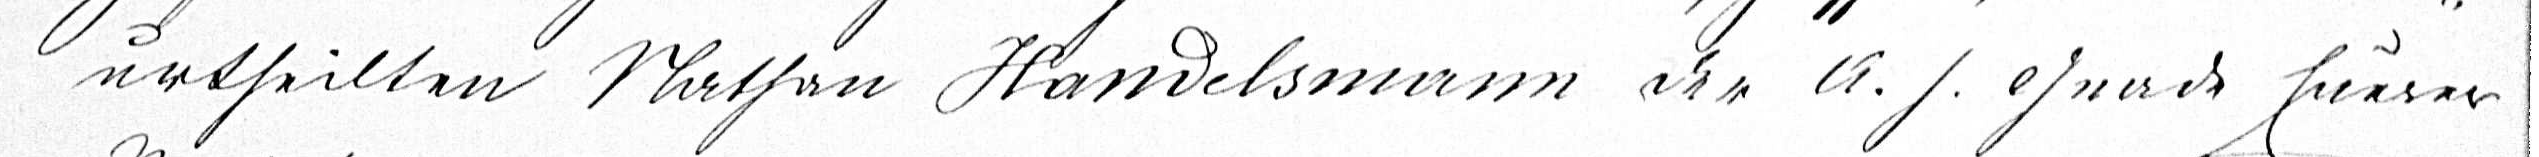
urtheilten Nathan Handelsmann der A. h. Gnade Eurer
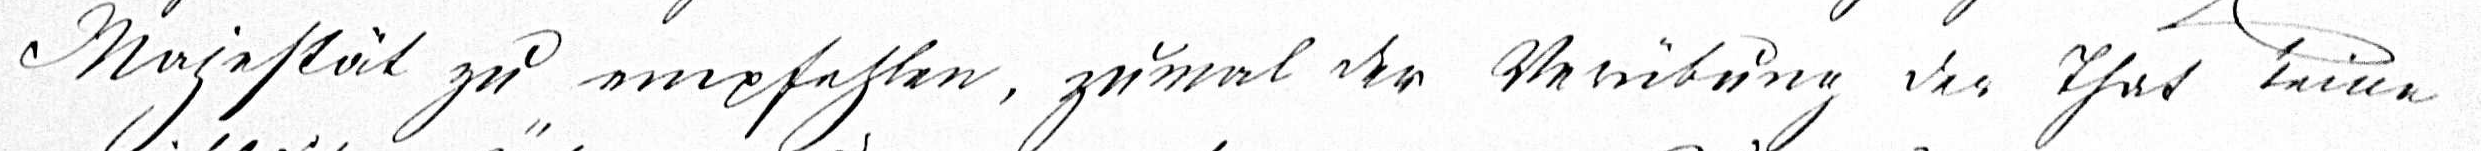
Majestät zu empfehlen, zumal der Verübung der That keine
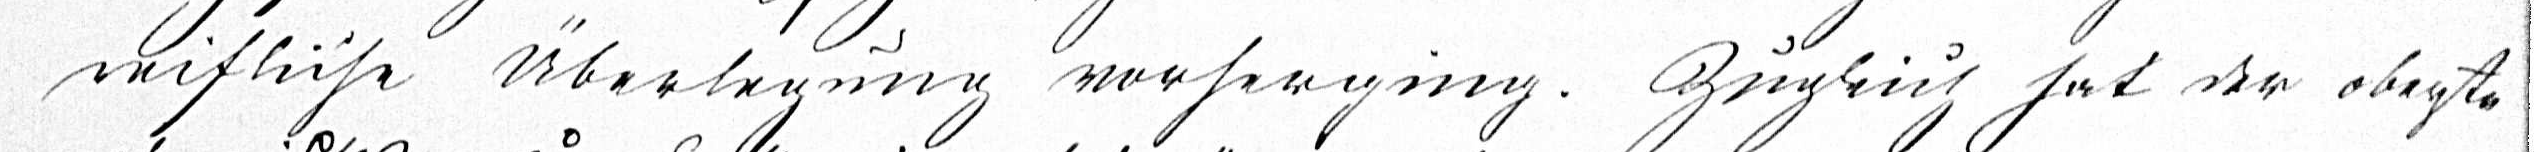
reifliche Überlegung vorherging. Zugleich hat der oberste
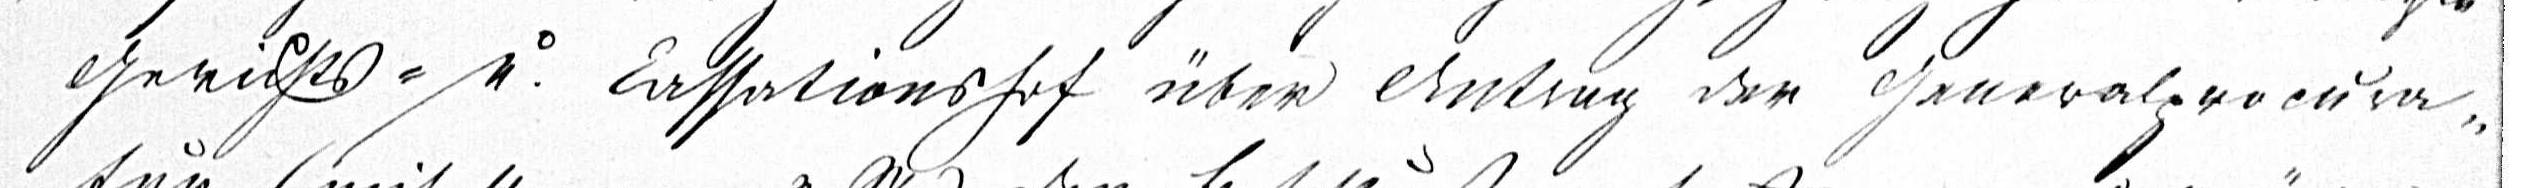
Gerichts- u. Cassationshof über Antrag der Generalprocura¬
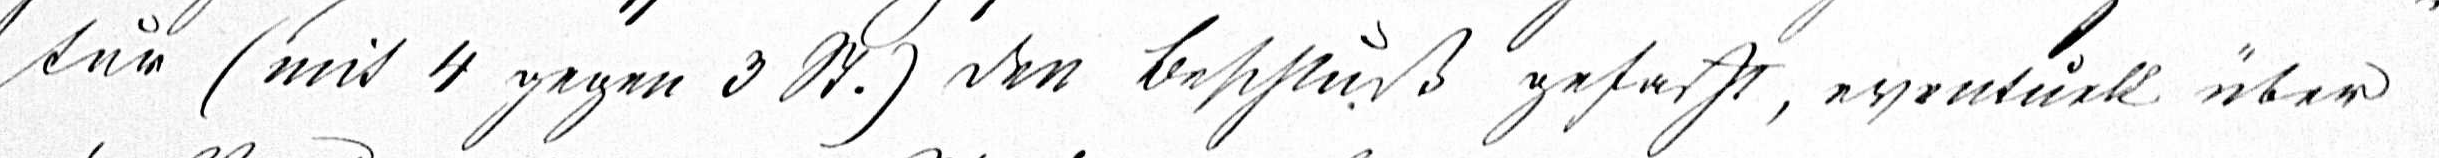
tur (mit 4 gegen 3 St.) den beschluß gefaßt, eventuell über
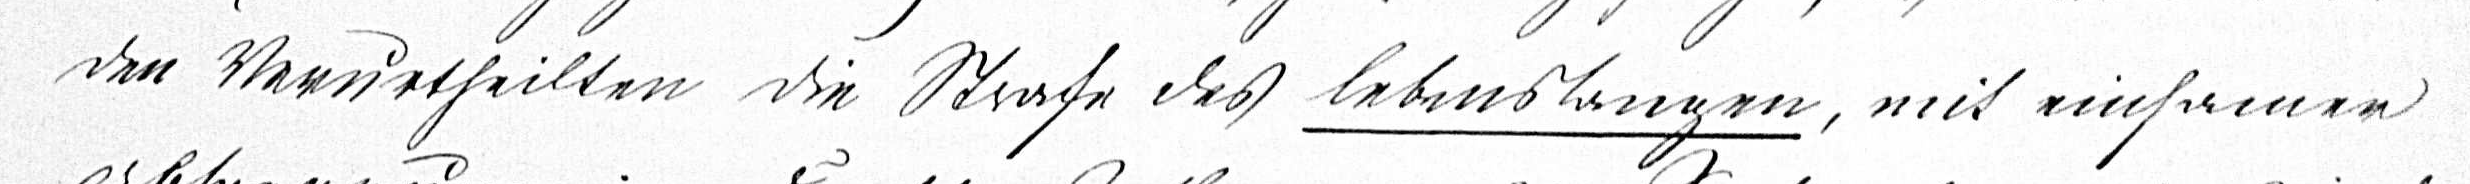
den Verurtheilten die Strafe des lebenslangen, mit einsamen
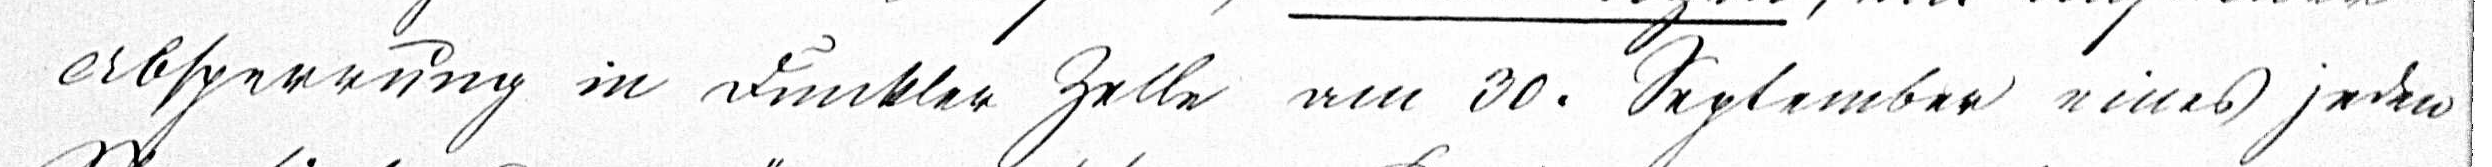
Absperrung in dunkler Zelle am 30 September eines jeden
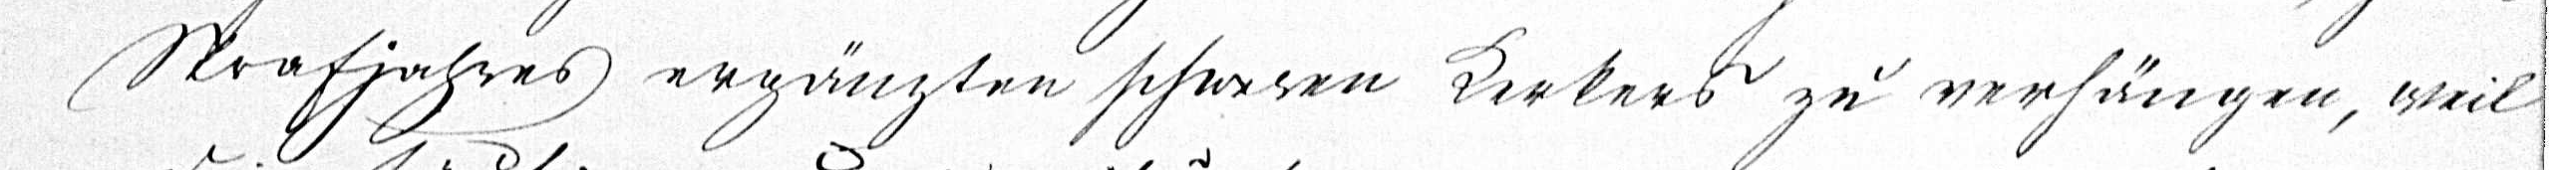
Strafjahres ergänzten schweren Kerkers zu verhängen, weil
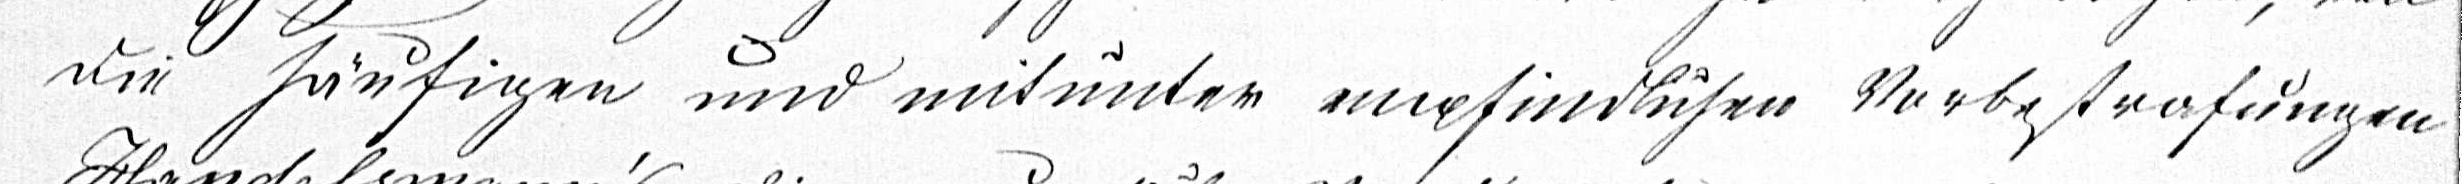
die häufigen und mitunter empfindlichen Vorbestrafungen
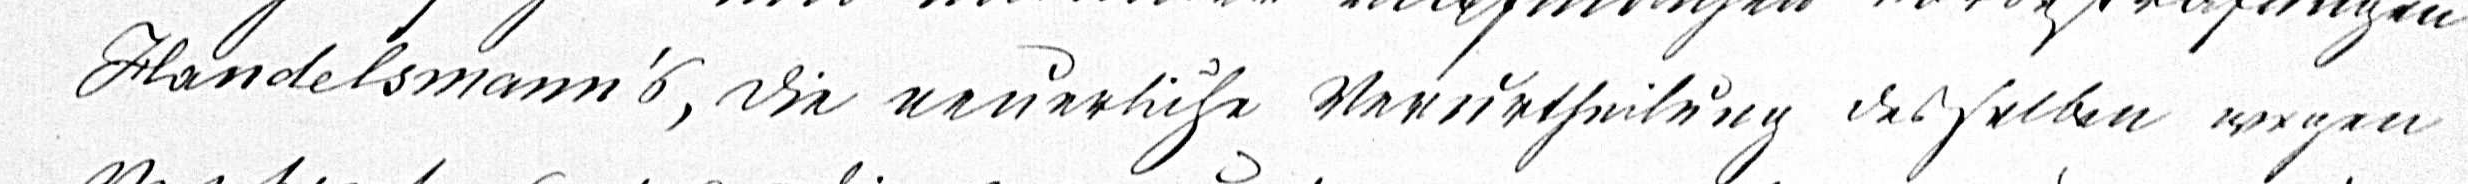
Handelsmann’s, die neuerliche Verurtheilung desselben wegen
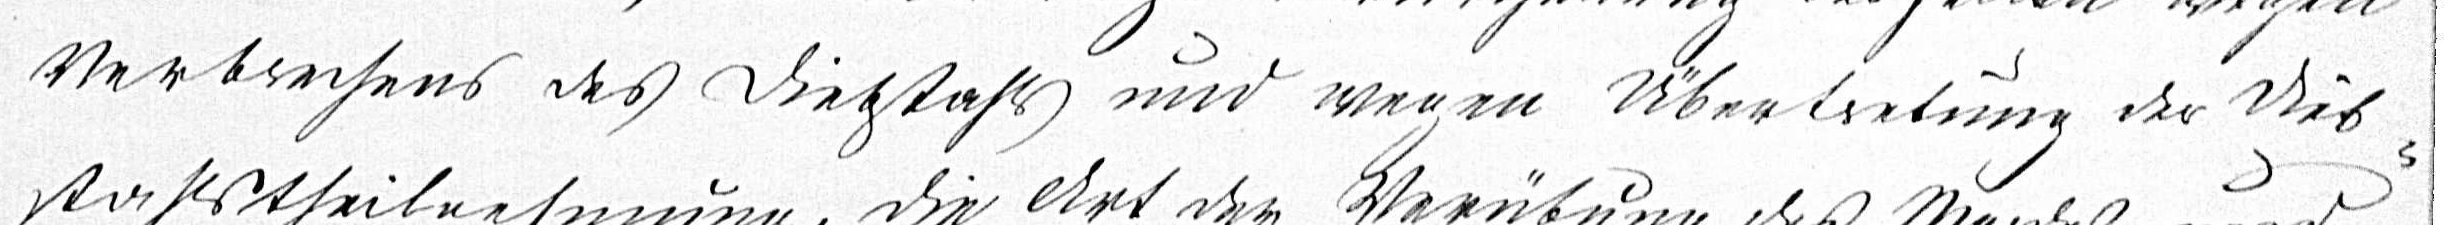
Verbrechens des Diebstahls und wegen Übertretung der Dieb¬
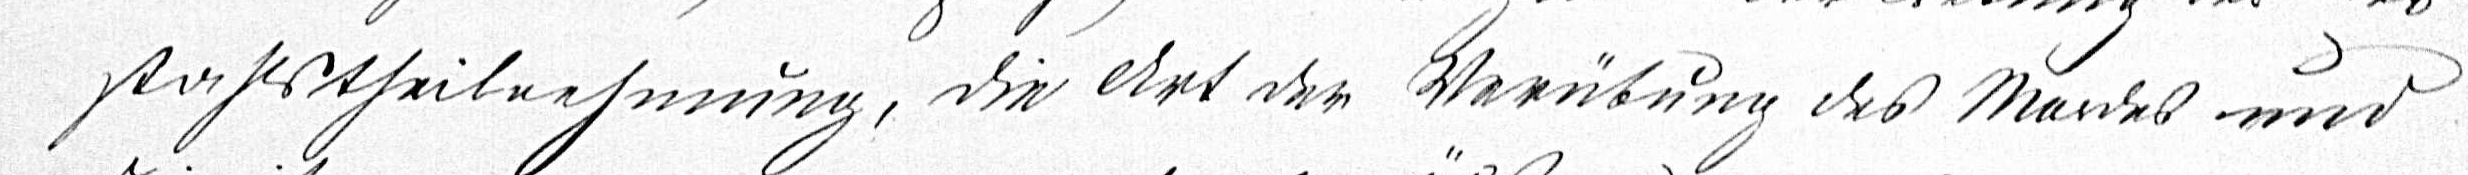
stahlsteilnehmung, die Art der Verübung des Mordes und
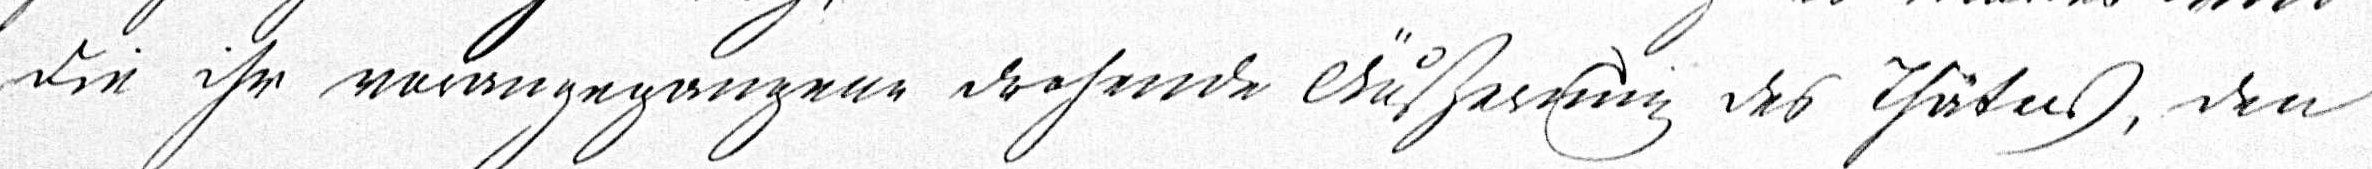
die ihr vorangegangene drohende Äußerung des Thäters, den
